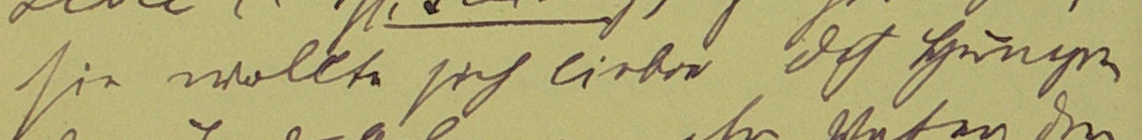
Sie wolte sich lieber durch Hunger
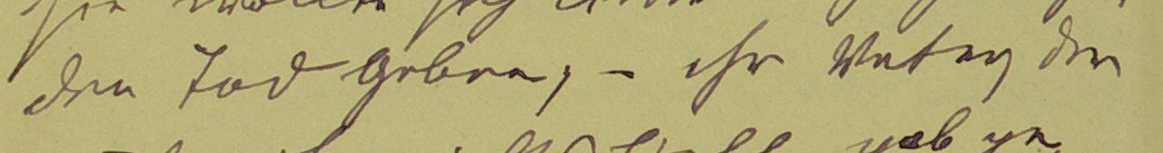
den Tod geben.,- ihr Vater der
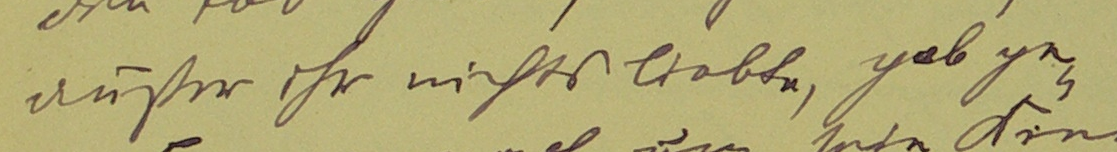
der außer ihr nichts liebte, gab ge¬
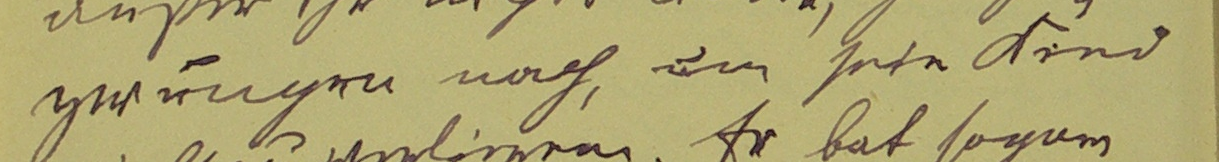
zwungenermaßen nach , um sein Kind
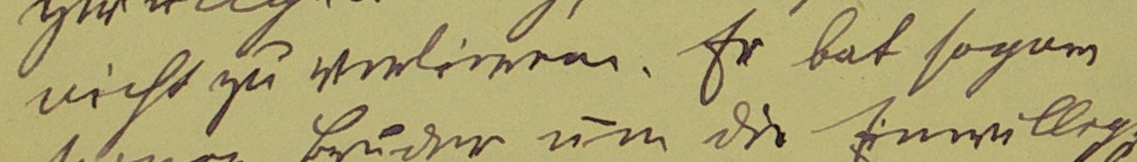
nicht zu verlieren.Er bat sogar
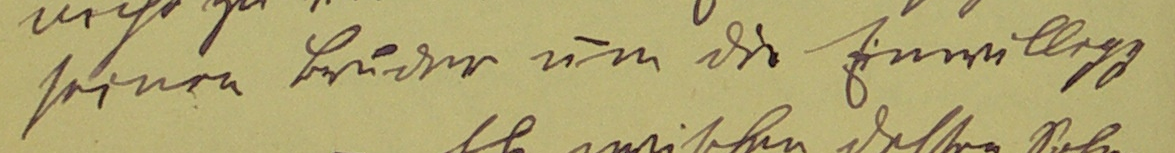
seinen Bruder um die Einwilligung
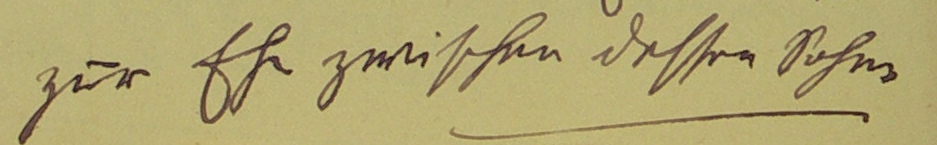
zur Ehe zwischen dessen Sohn
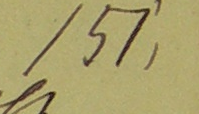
151
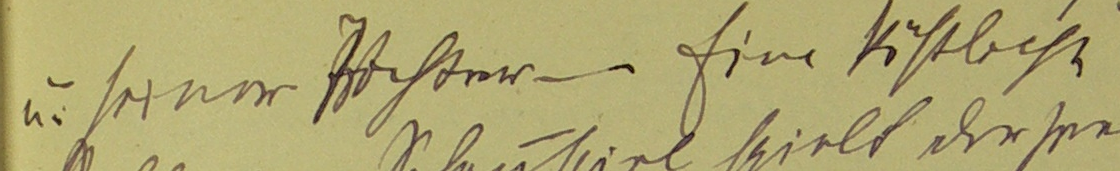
und seiner Tochter.- Eine köstlich
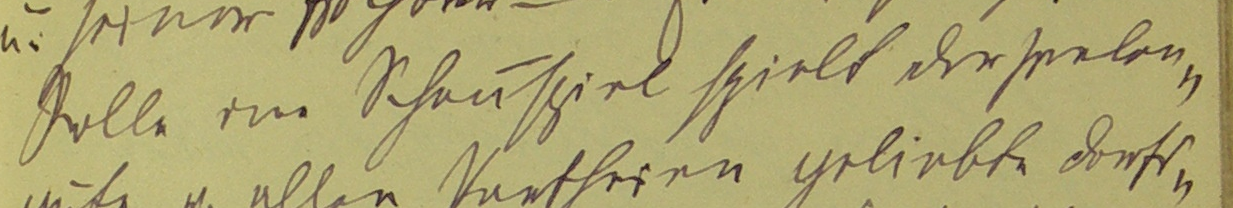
Rolle im Schauspiel spielt der selen¬
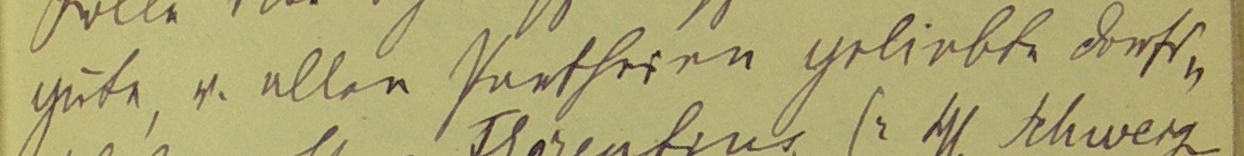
gute , von allen Partheien geliebte Dorf¬
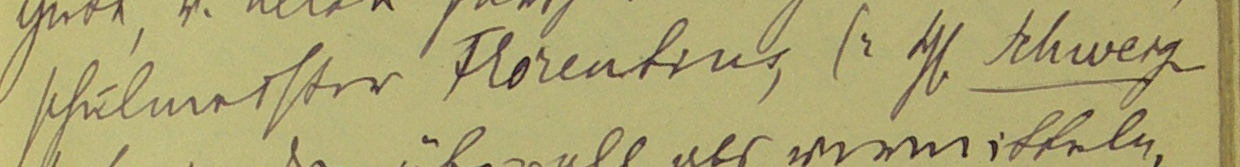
schulmeister Florentins (:H. Schwerg
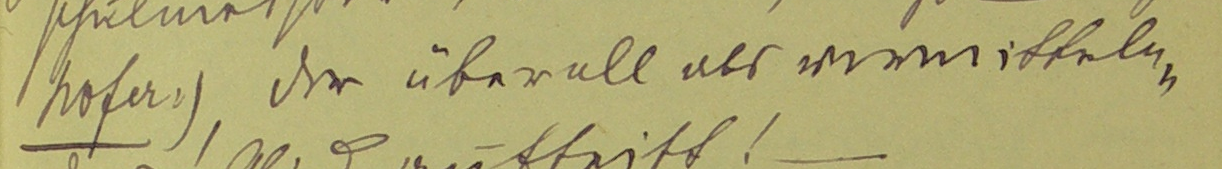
Hofer:), der überall als vermitteln¬
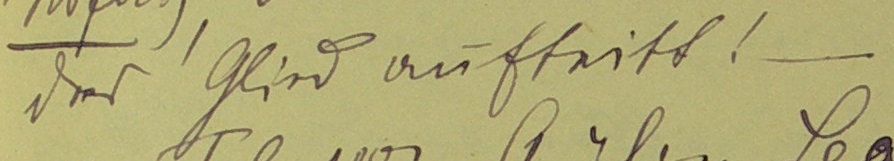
des Glied auftritt.—
